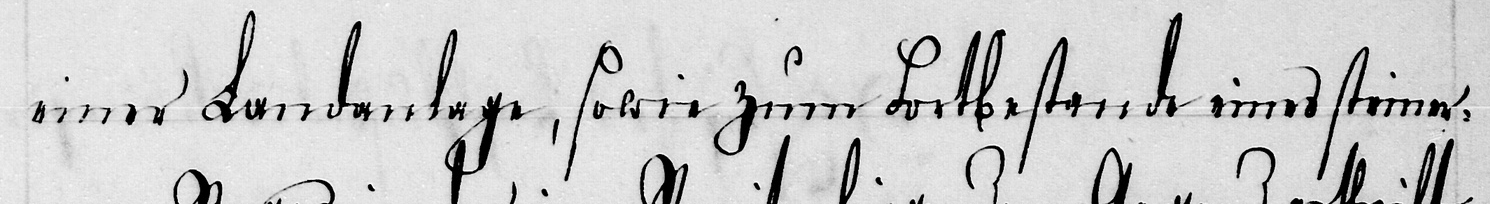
einer Landanlage, sowie zum Fortbestande eines steine¬
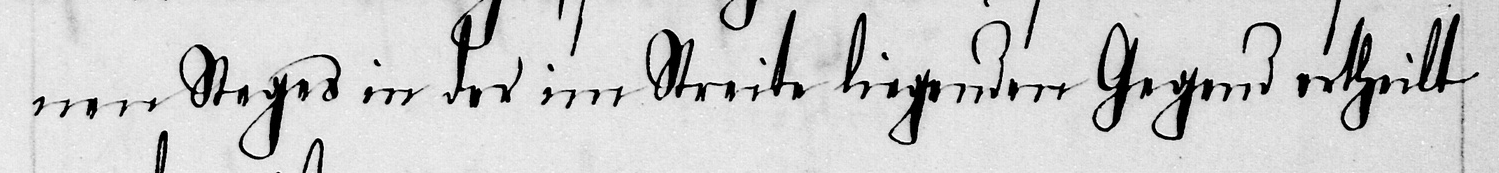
rnen Steges in der im Streite liegenden Gegend ertheilt
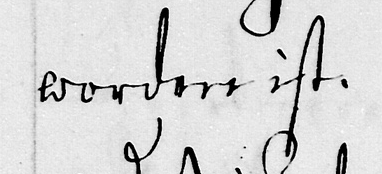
worden ist.
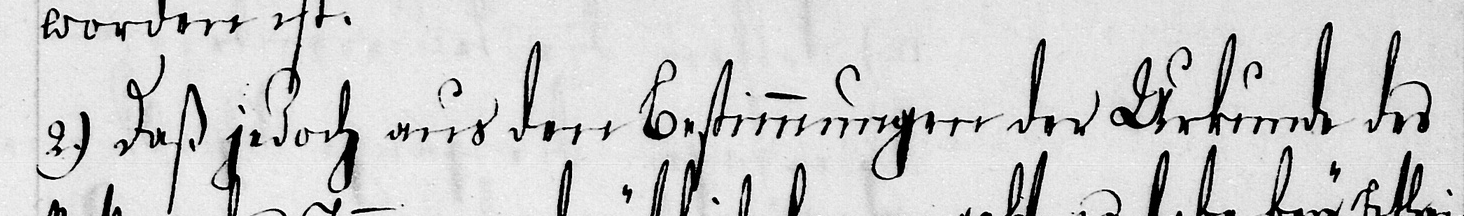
2.) Daß jedoch aus den Bestimmungen der Urkunde des
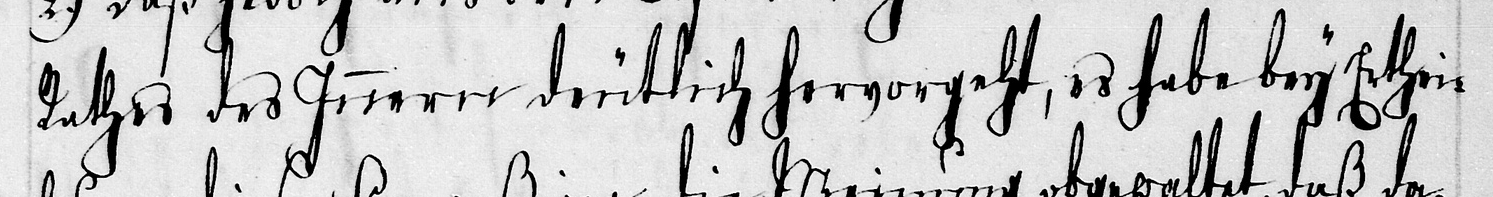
Rathes des Innern deutlich hervorgeht, es habe bey Erthei¬
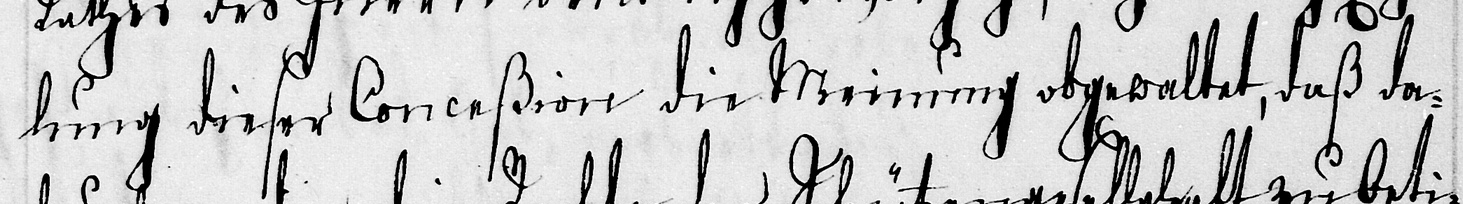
lung dieser Conceßion die Meinung obgewaltet, daß da¬
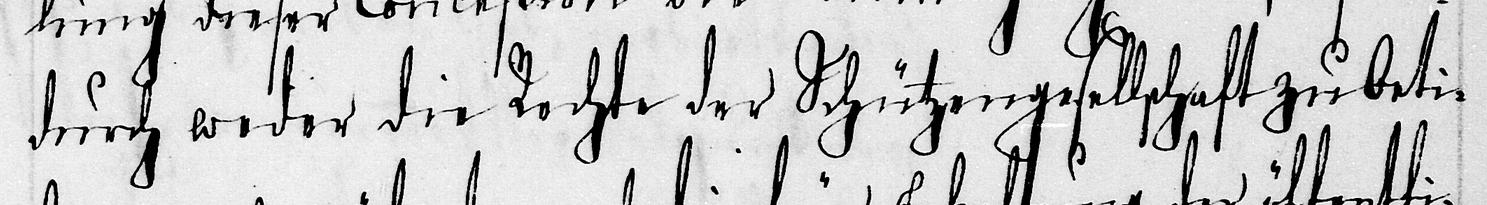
durch weder die Rechte der Schützengesellschaft zu Oet¬
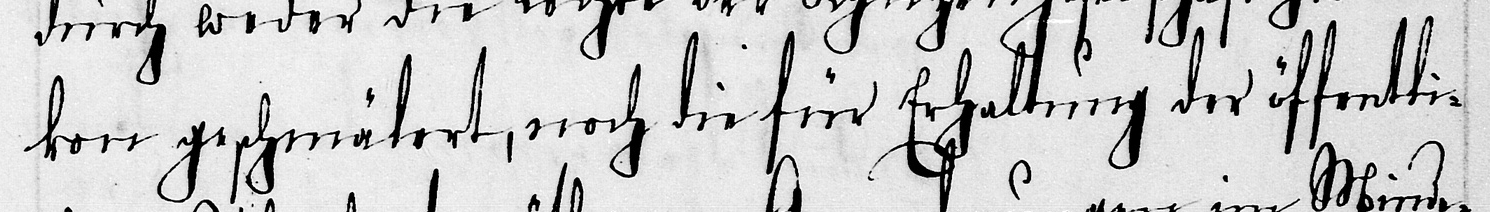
ikon geschmälert, noch die für Erhaltung der öffentli¬
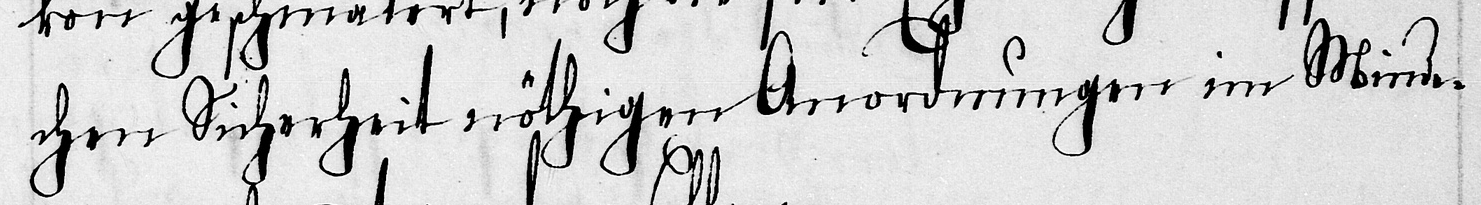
chen Sicherheit nöthigen Anordnungen im Minde¬
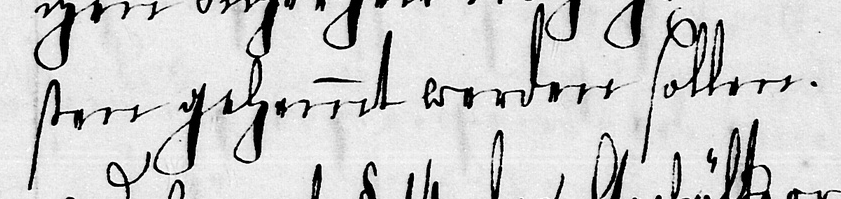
sten gehemmt werden sollen.
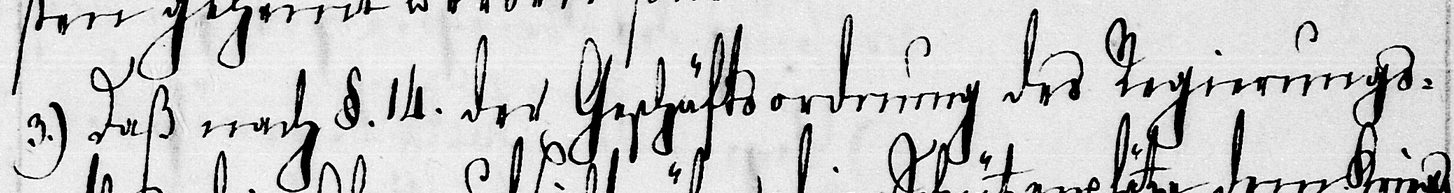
3.) Daß nach §. 14. der Geschäftsordnung des Regierungs¬
